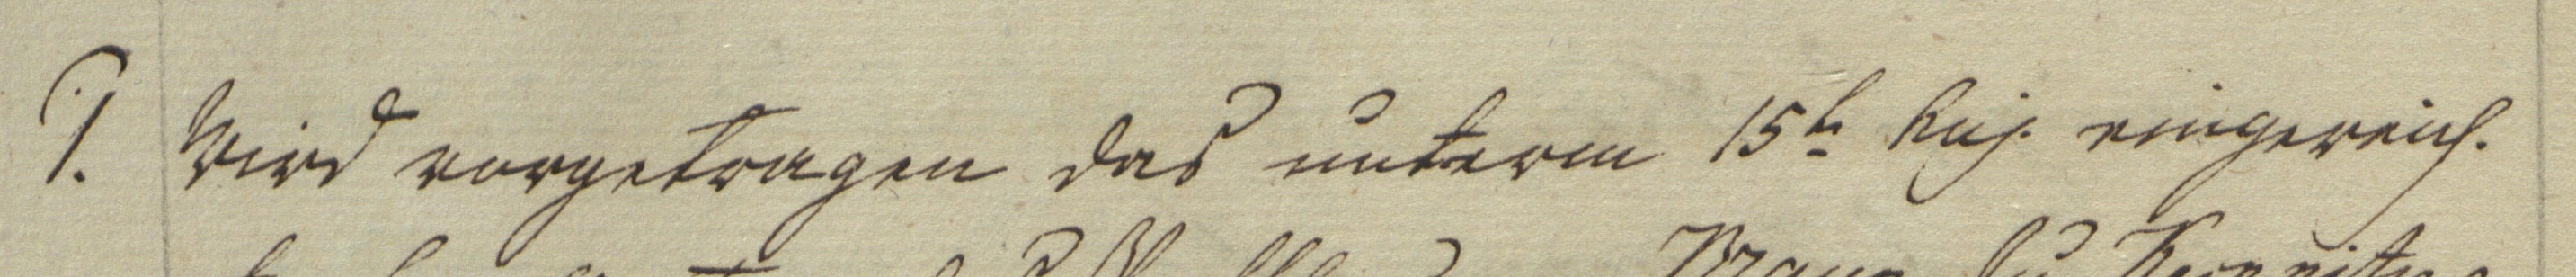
1. Wird vorgetragen das unterm 15 te huj. eingereich¬
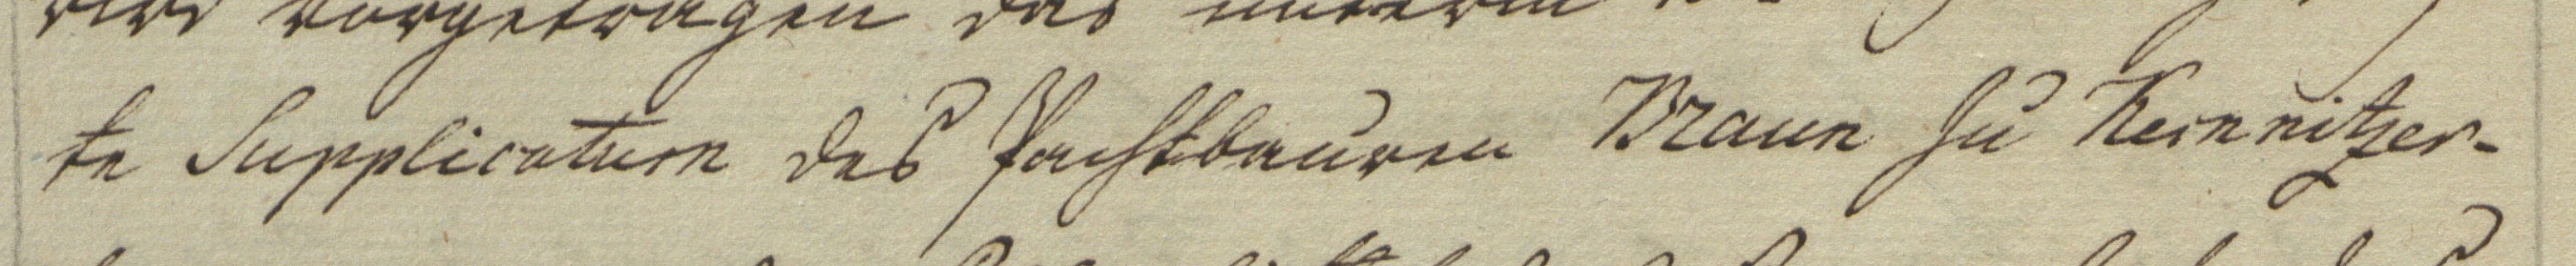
te Supplicatum des Pachtbauren Braun zu Kemnitzer¬
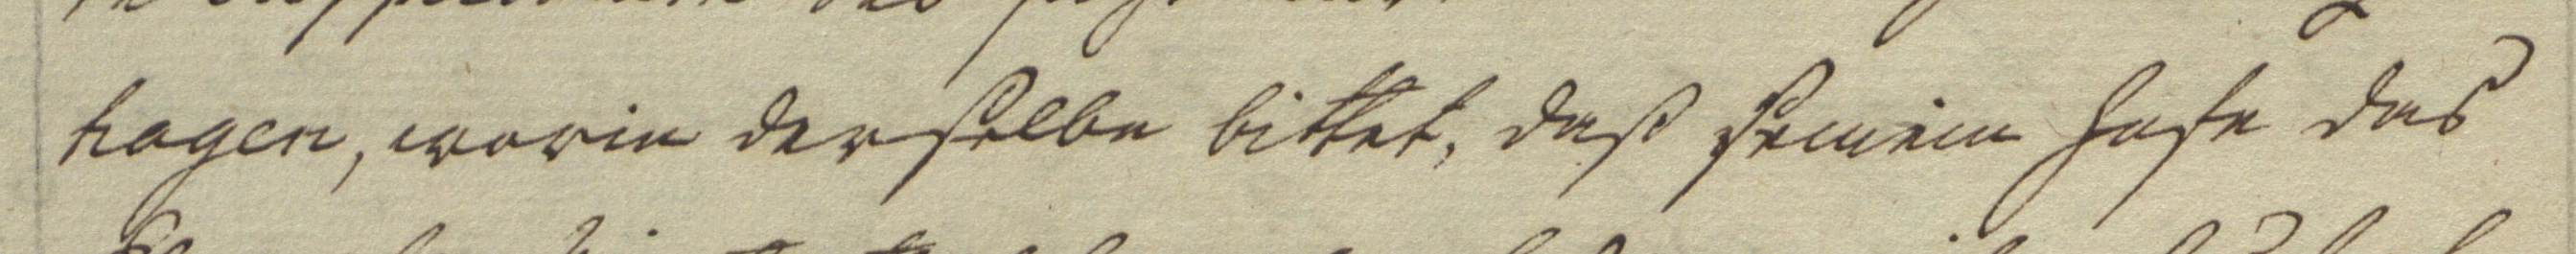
hagen, worin derselbe bittet, daß seinem Hofe das
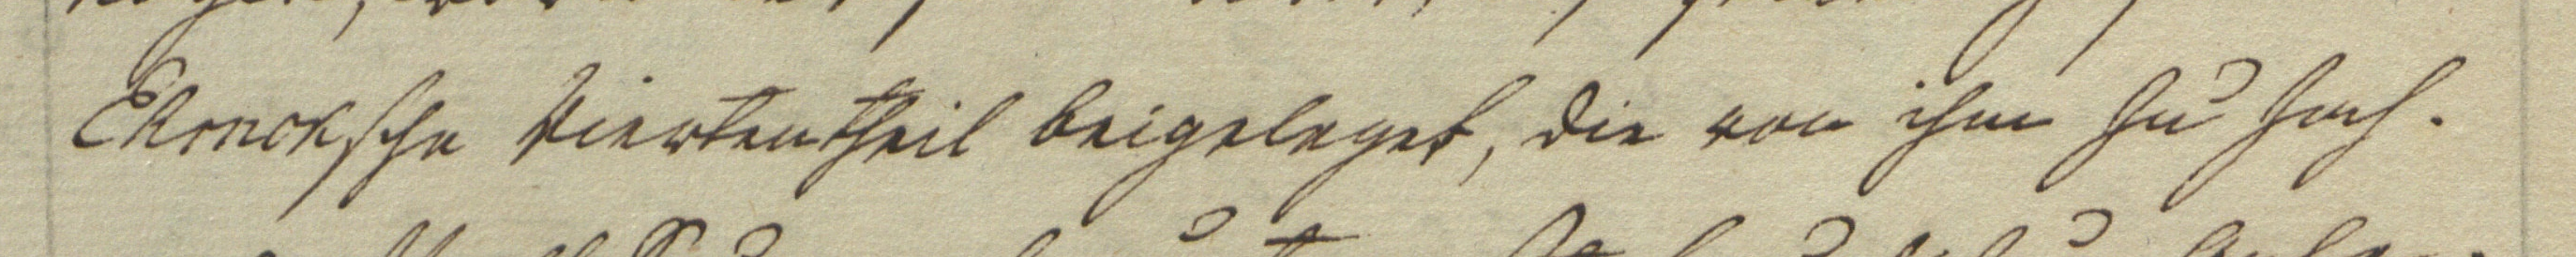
Ehmcksche Viertentheil beigeleget, die von ihm zu zah¬
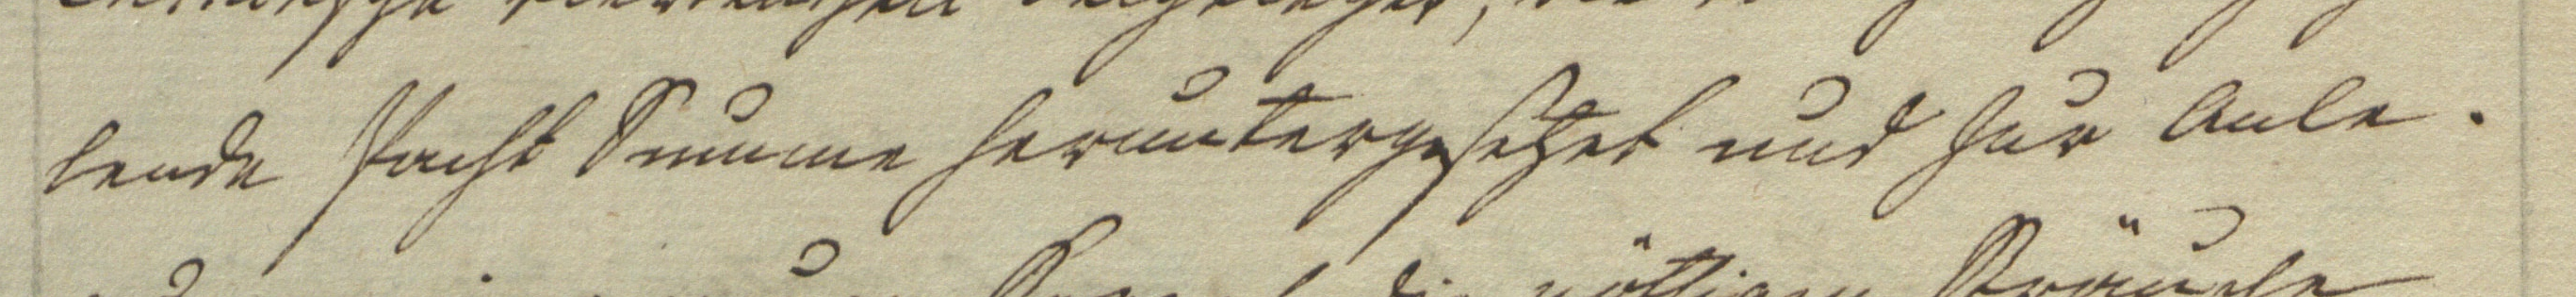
lende Pacht Summe heruntergesetzet und zur Anle¬
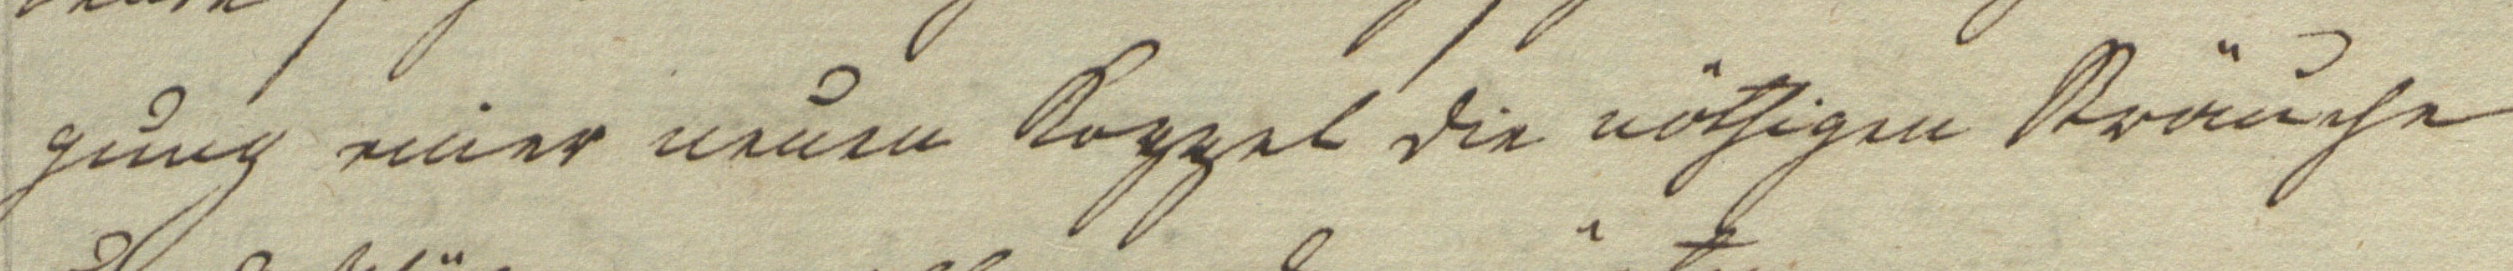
gung einer neuen Koppel die nöthigen Sträuche
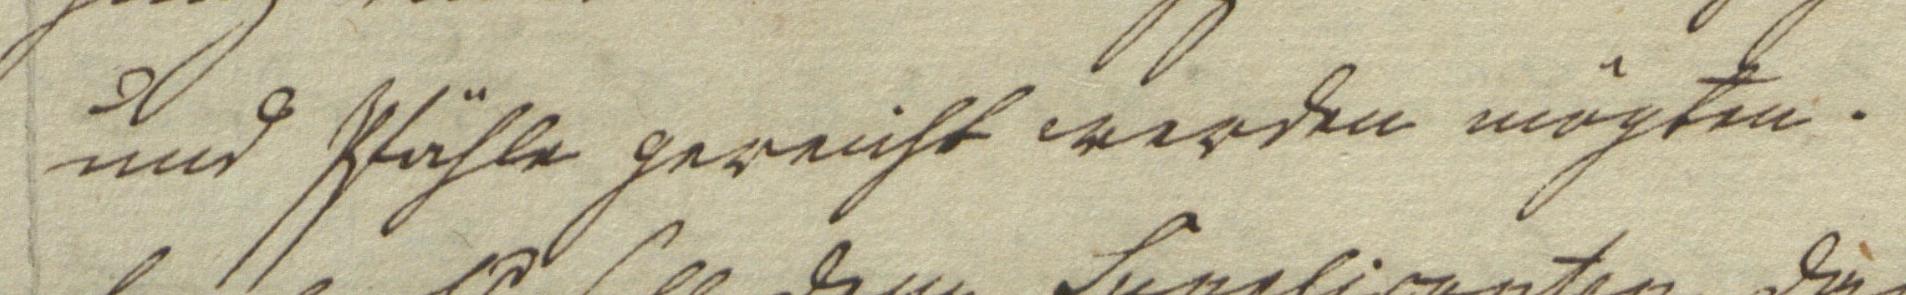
und Pfähle gereicht werden mögten.
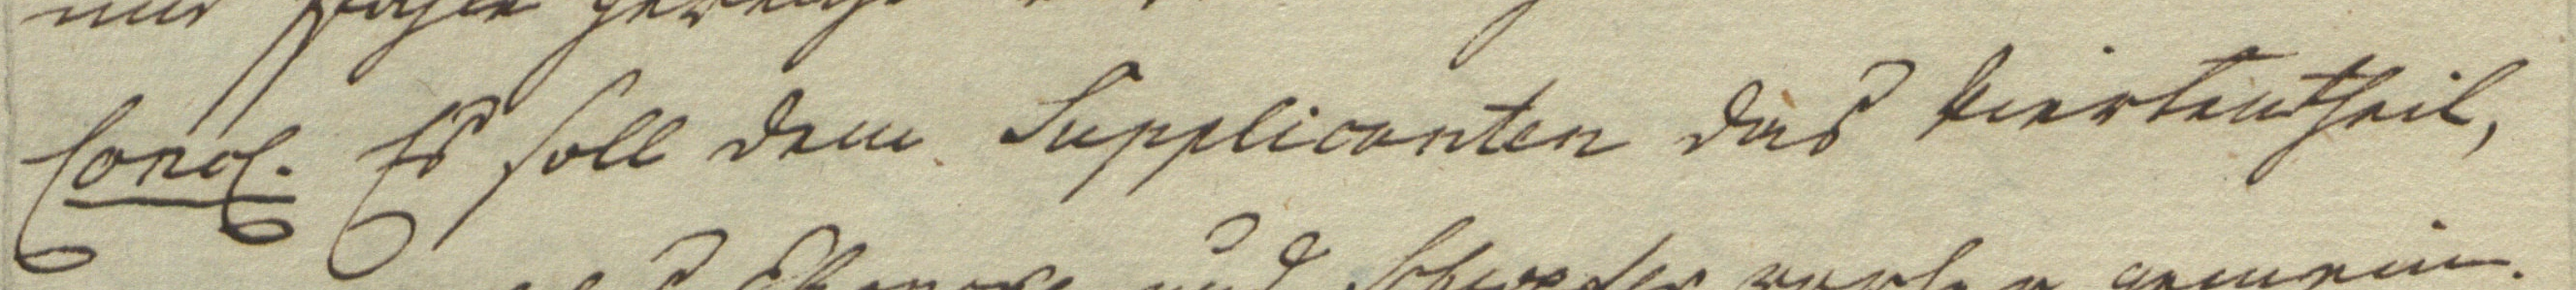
Concl. Es soll dem Supplicanten das Viertentheil,
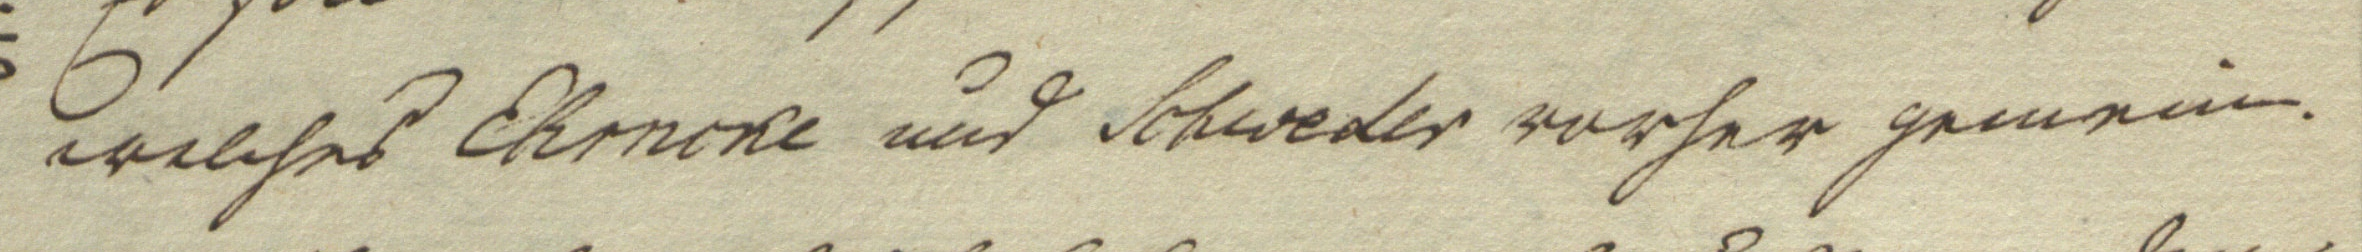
welches Ehmcke und Schweder vorher gemein¬
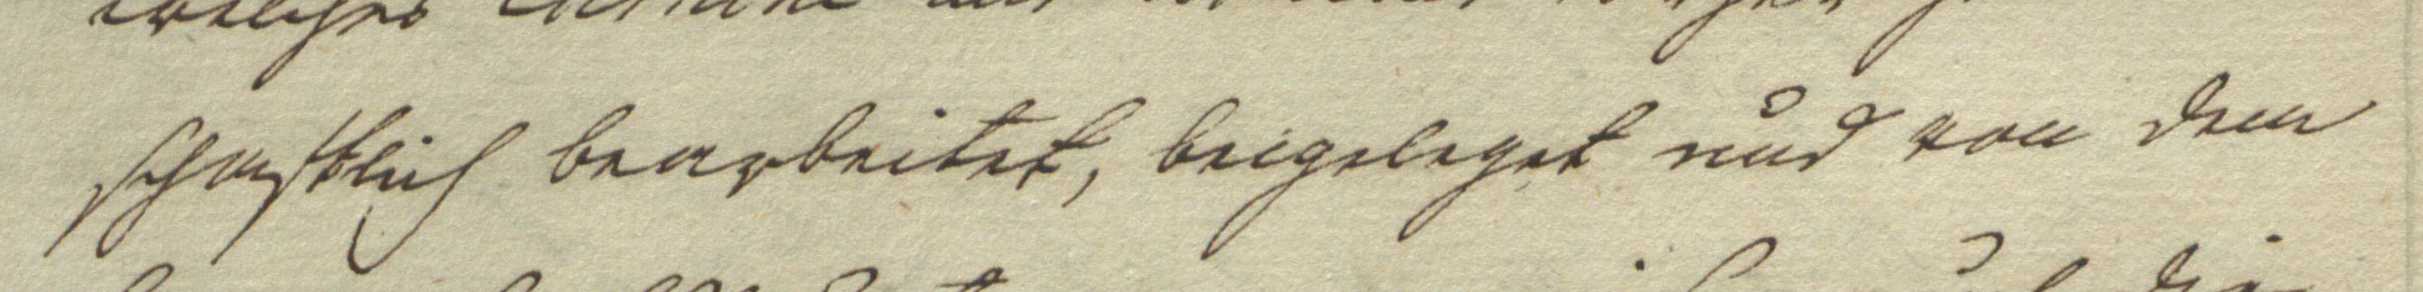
schaftlich bearbeitet, beigeleget und von dem
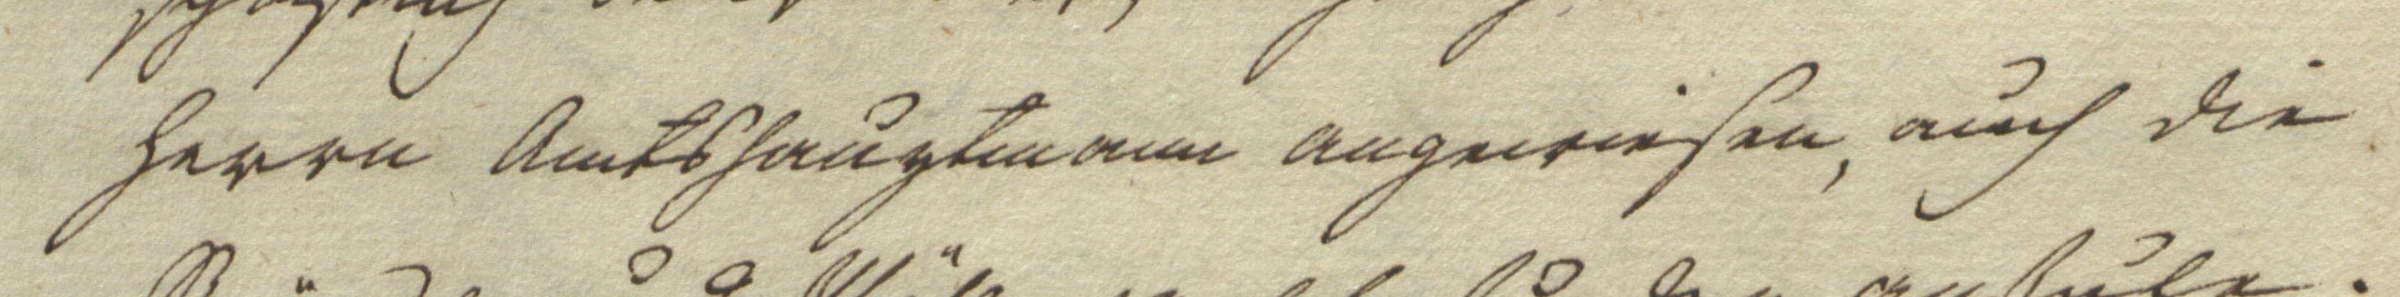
Herrn Amtshauptmann angewiesen, auch die
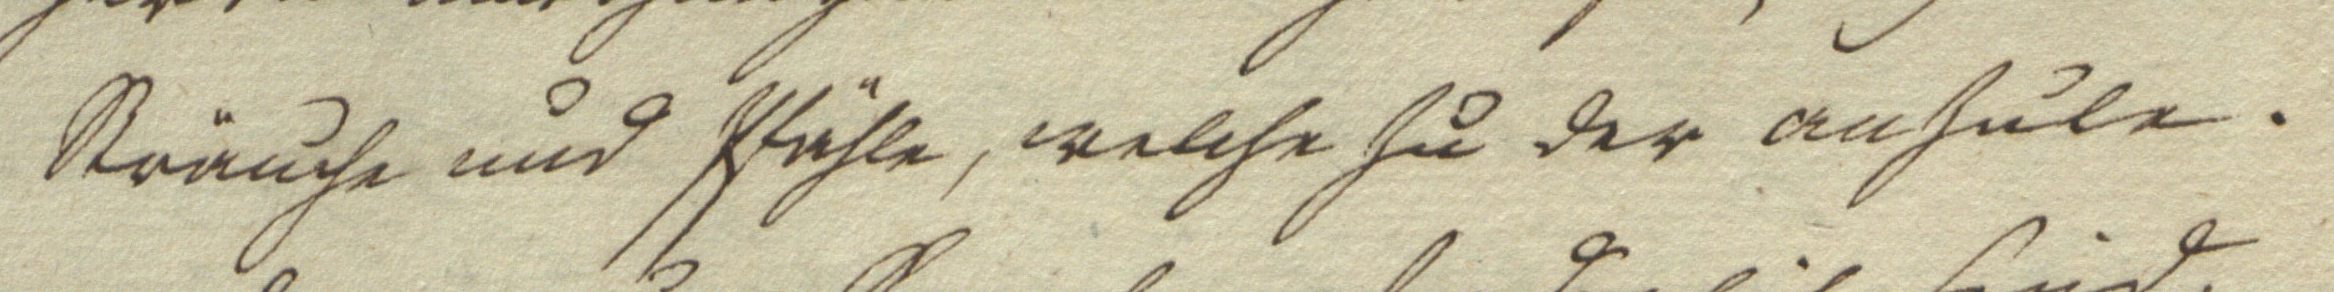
Sträuche und Pfähle, welche zu der anzule¬
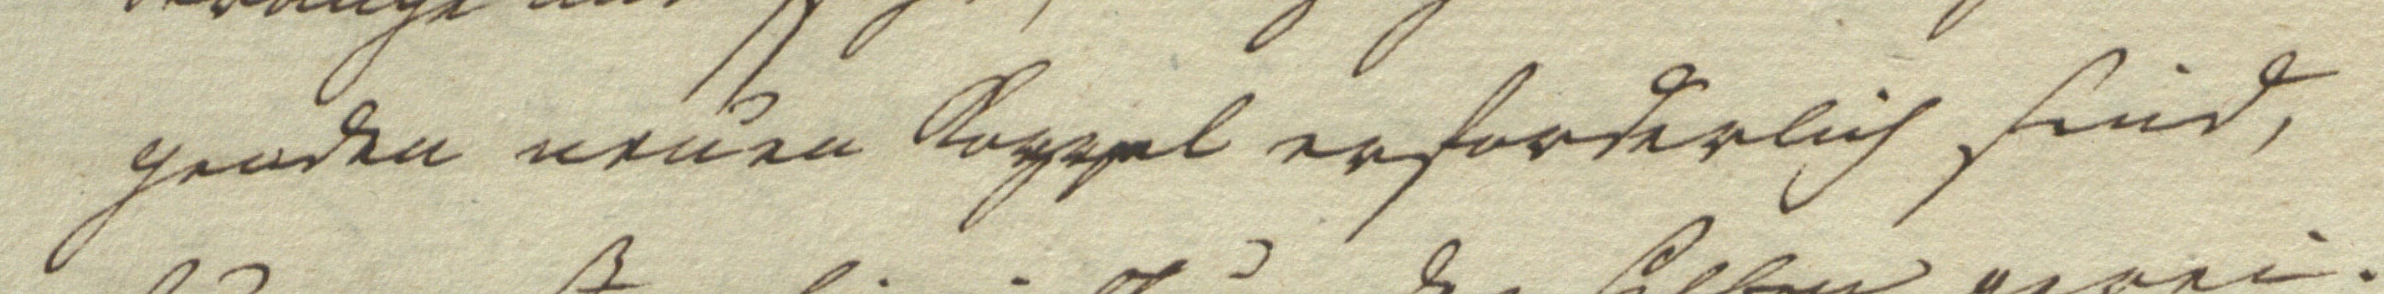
genden neuen Koppel erforderlich sind,
